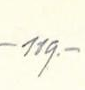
119
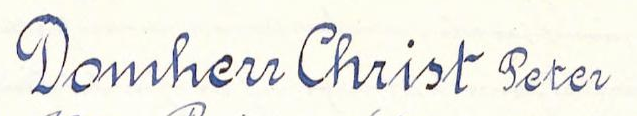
Domherr Christ Peter
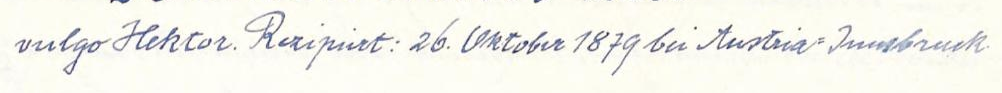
vulgo Hektor. Rezipiert: 26. Oktober 1879 bei Austria- Innsbruck
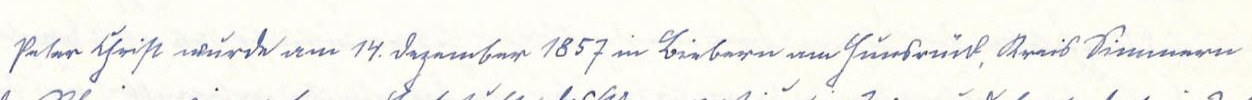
Peter Christ wurde am 14. Dezember 1857 in Biebern im Hunsrück, Kreis Simmern
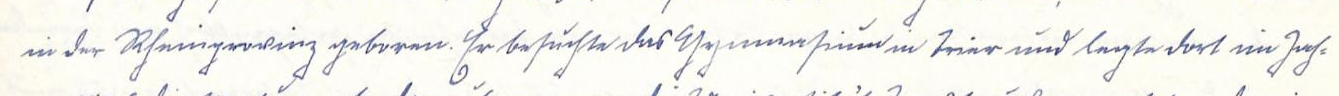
in der Rheinprovinz geboren. Er besuchte das Gymnasium in Trier und legte dort im Jah-
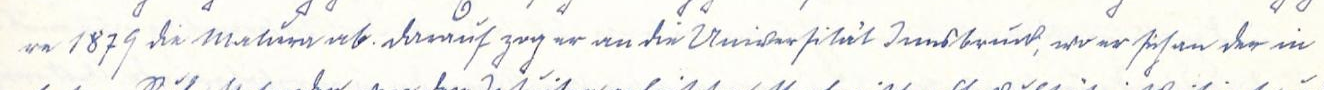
re 1879 die Matura ab. Darauf zog er an die Universität Innsbruck, wo er sich an der in
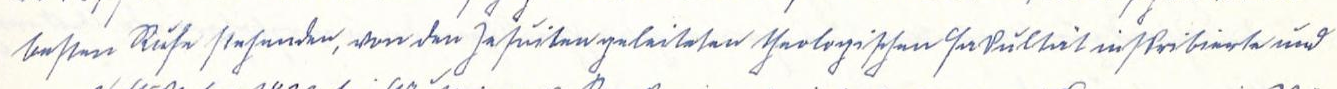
besten Rufe stehenden, von den Jesuiten geleiteten theologischen Fakultät inskribierte und
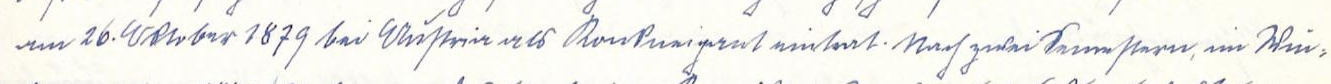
am 20. Oktober 1879 bei Austria als Konkneipant eintrat. Nach zwei Semestern, im Wien-
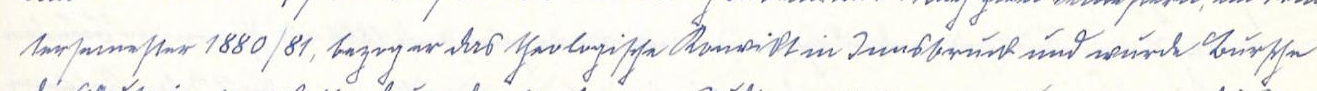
tersemester 1880 /81, bezog er das theologische Konvikt in Innsbruck und wurde Bursche
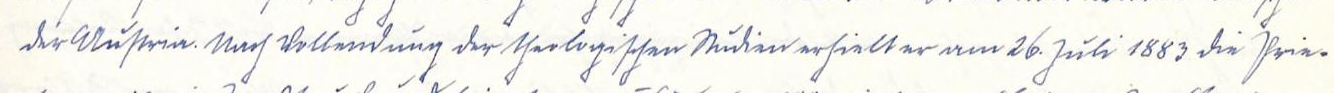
der Austria. Nach Vollendung der theologischen Studien erhielt er am 26. Juli 1883 die Prie-
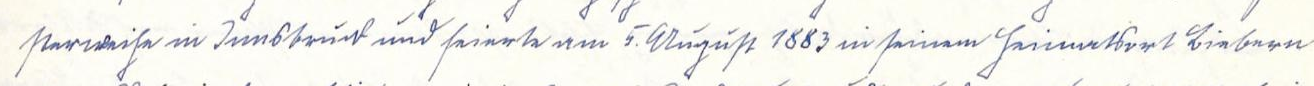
sterweihe in Innsbruck und feierte am 5. August 1883 in seinem Heimatort Biebern
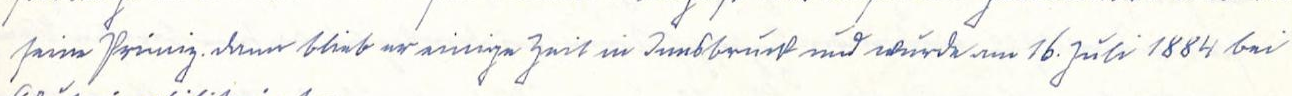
seine Primiz. Dann blieb er einige Zeit in Innsbruck und wurde am 16. Juli 1884 bei
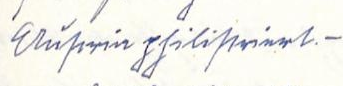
Austria philistriert.-
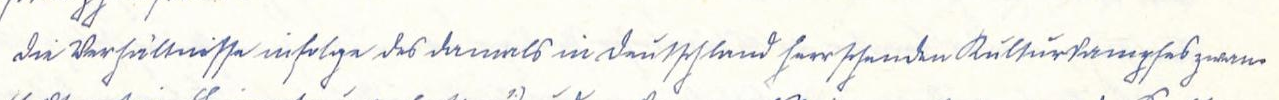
Die Verhältnisse infolge des damals in Deutschland herrschenden Kulturkampfes zwan-
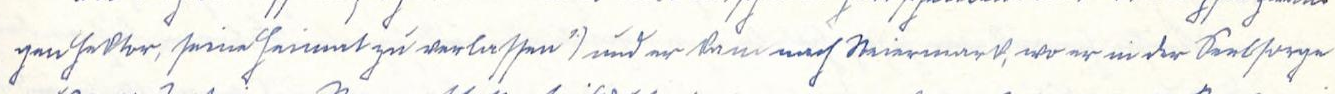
gen Hektor, seine Heimat zu verlassen 1) und er kam nach Steiermark, wo er in der Seelsorge
